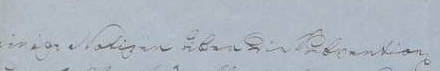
einige Notizen über die Subventionen
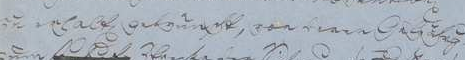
zu erhalten gewünscht, von deren Gewährung
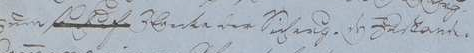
zum Behufe Zwecke der Sicherung ds Zustande-
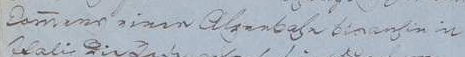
kommens einer Alpenbahn bis anhin in
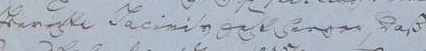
Berichte Jacini's geht hervor, daß
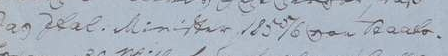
das Ital. Minister. 1855/6 von Staats-
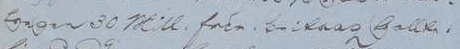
wegen 30 Mill. Frkn. beitragen wollte.
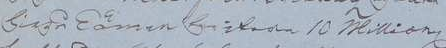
Hiezu kämen weitere 10 Millionen
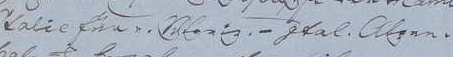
Italie für e. Schweiz.–Ital.Alpen -
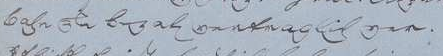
bahn zu bezalen vertraglich ver-
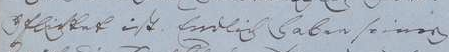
pflichtet ist. Endlich haben seiner
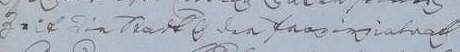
Zeit die Stadt & der Provinzialrath
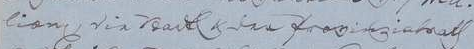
lionen, die Stadt & der Provinzialrath
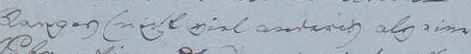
Ranges (nicht viel anderes als eine
